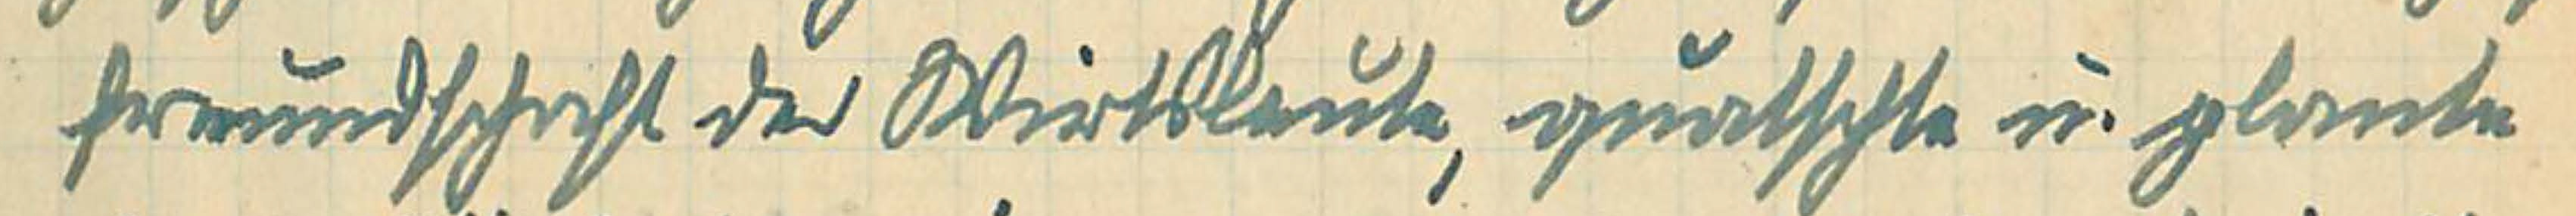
freundschaft der Wirtsleute, quatschte u. plante
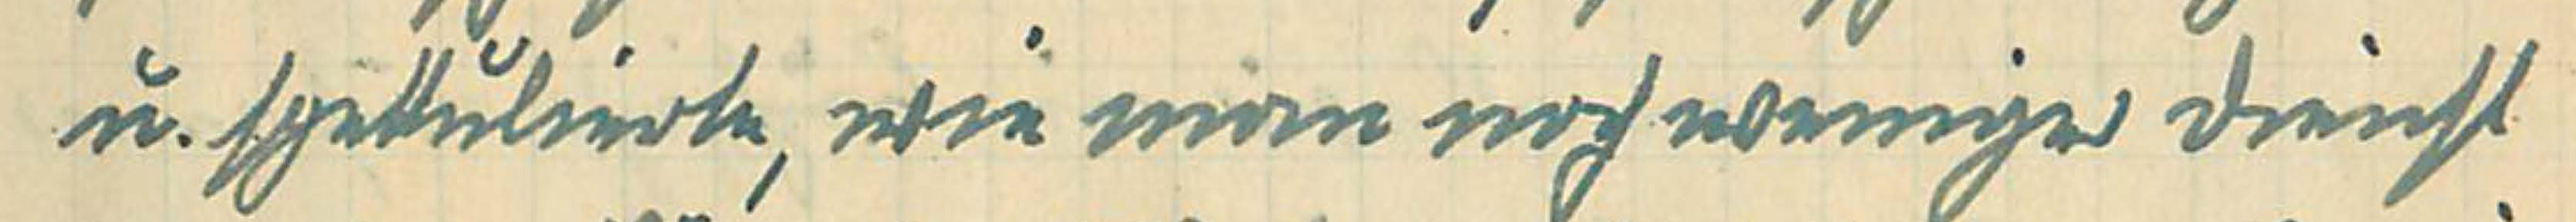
u. spekulierte, wie man noch weniger Dienst
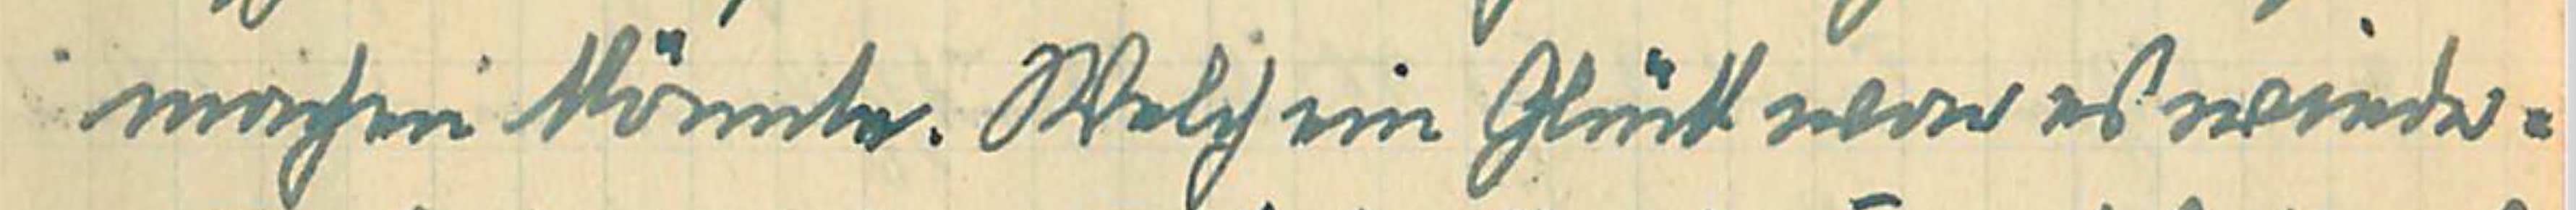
machen könnte. Welch ein Glück war es wieder-
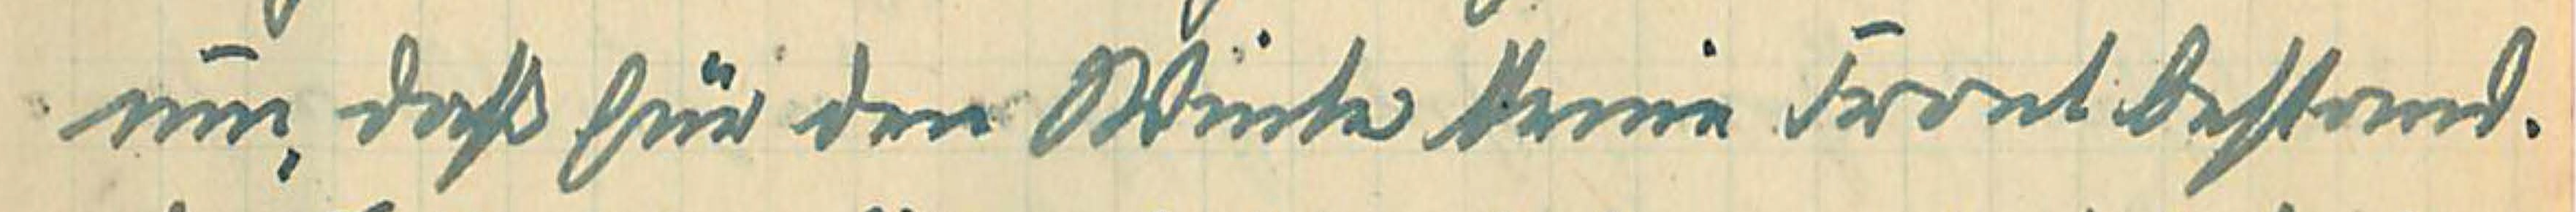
um, daß für den Winter keine Front bestand.
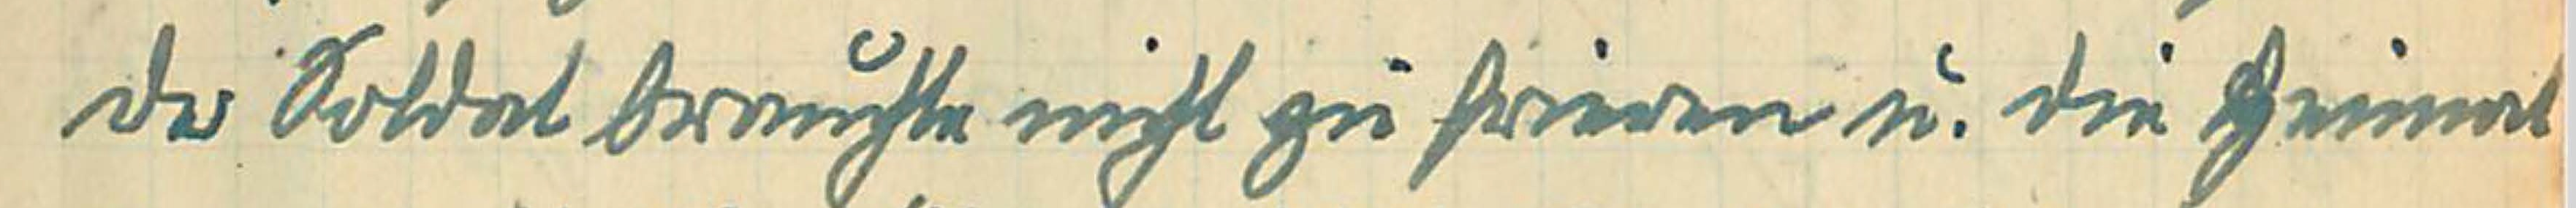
Der Soldat brauchte nicht zu frieren u. die Heimat
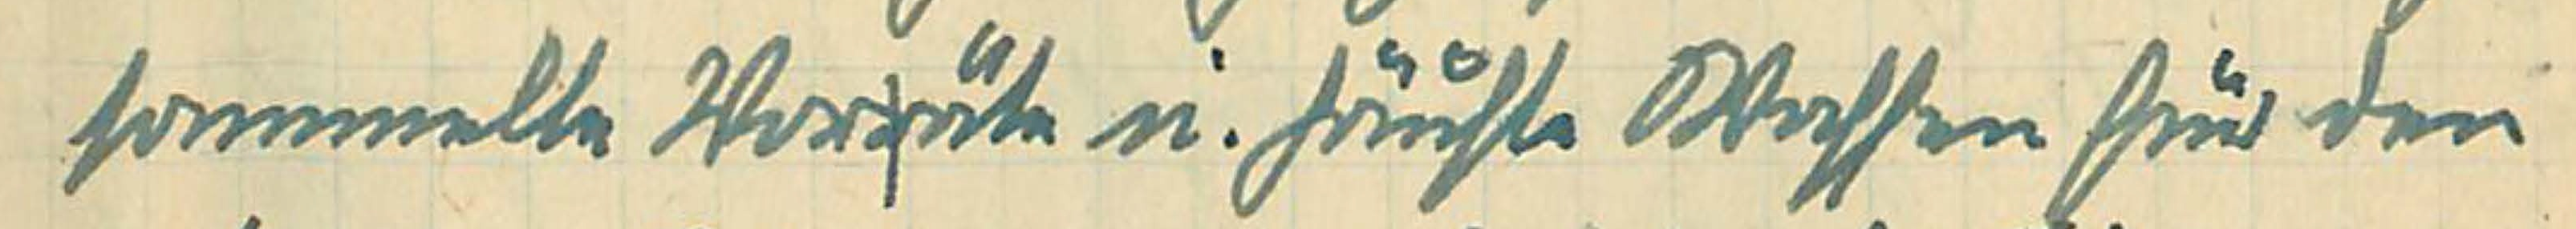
sammelte Vorräte u. häufte Waffen für den
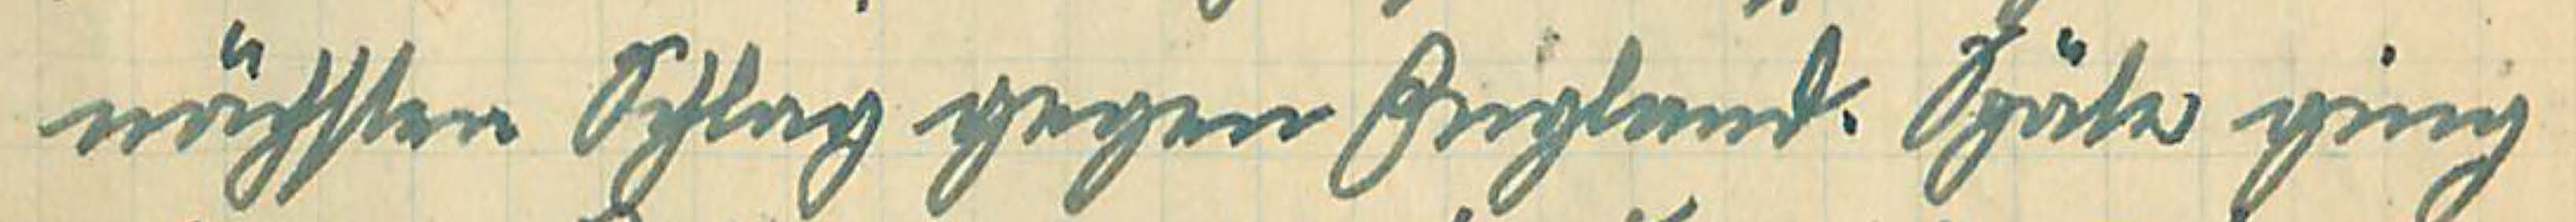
nächsten Schlag gegen England. Später ging
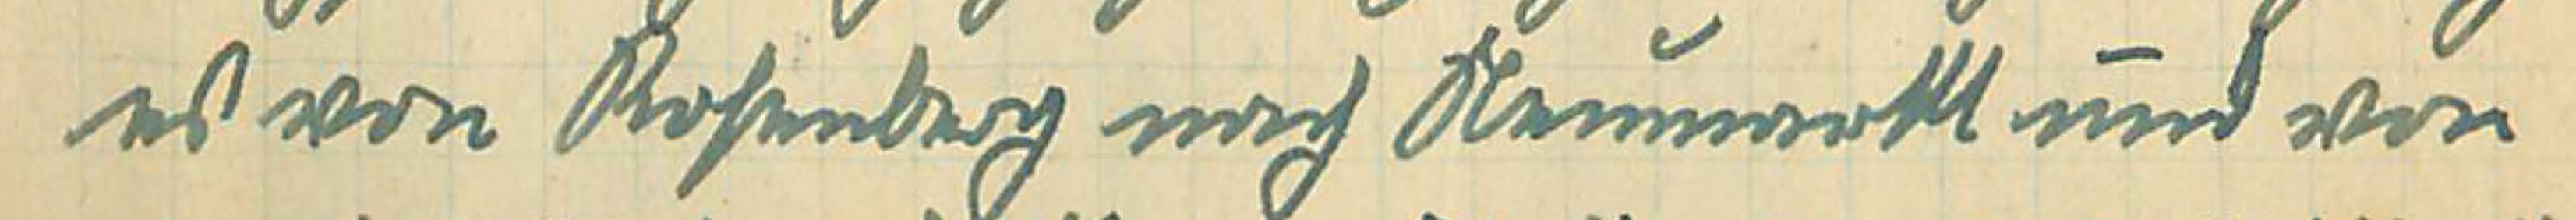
es von Rosenberg nach Neumarkt und von
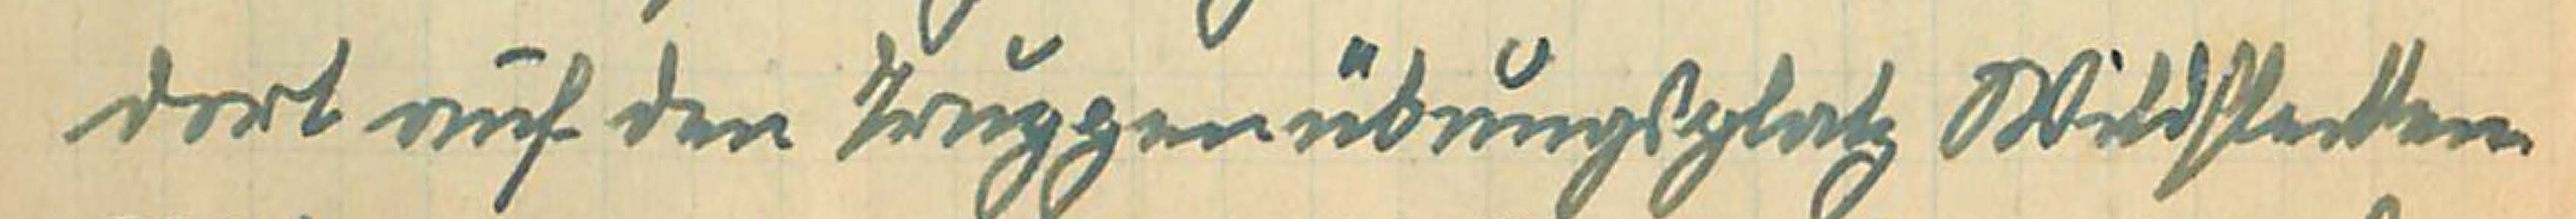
dort auf den Truppenübungsplatz Wildflecken.
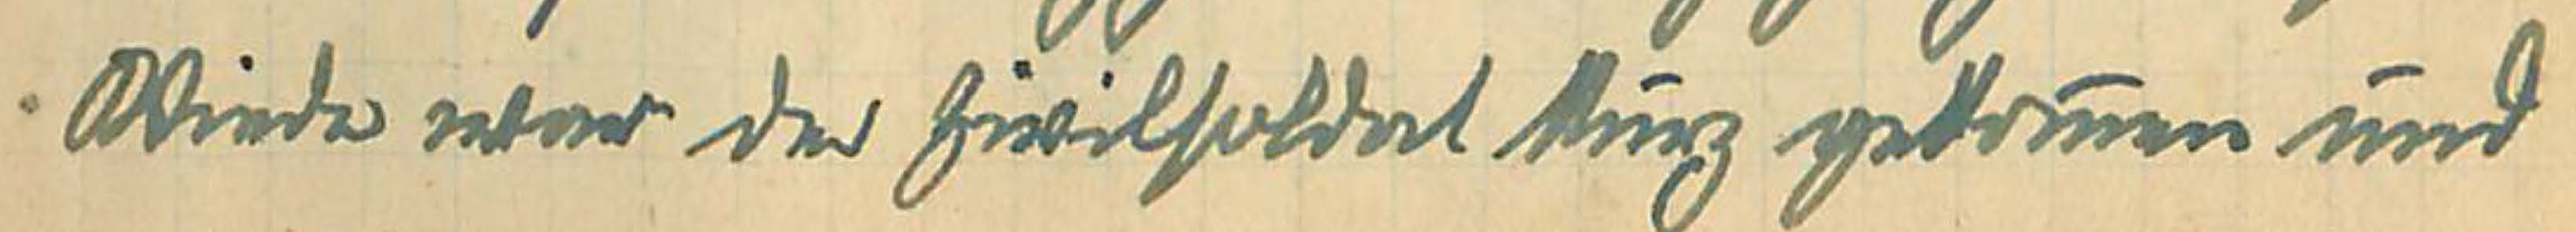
Wieder war der Zivilsoldat kurz gekommen und
